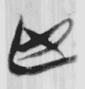臣
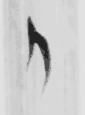人
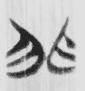非
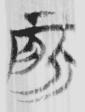所
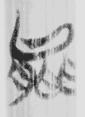能
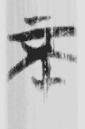不
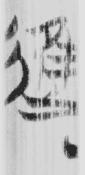進
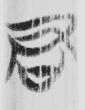君
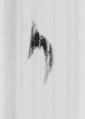人
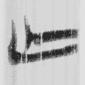亡
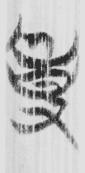事
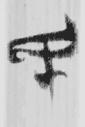民
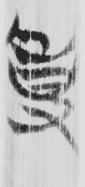事
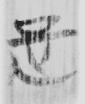是
